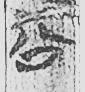公
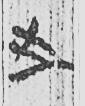之
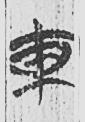車
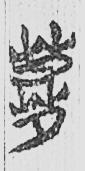{莫夕}
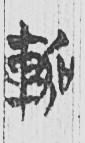{加車}
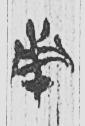用
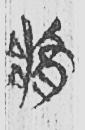{爿兔}
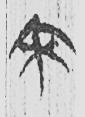宋
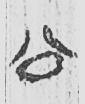公
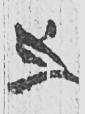之
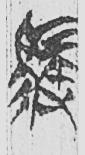馭
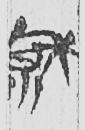穆
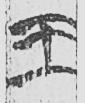王
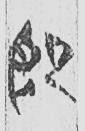即
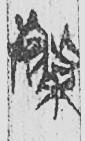殜
